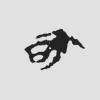可
